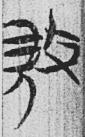{𡵂攴}（美）
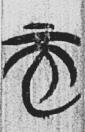而
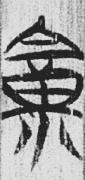○（富）
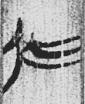於
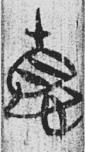惪
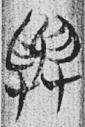與（歟）
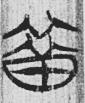昔
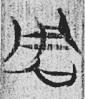周
